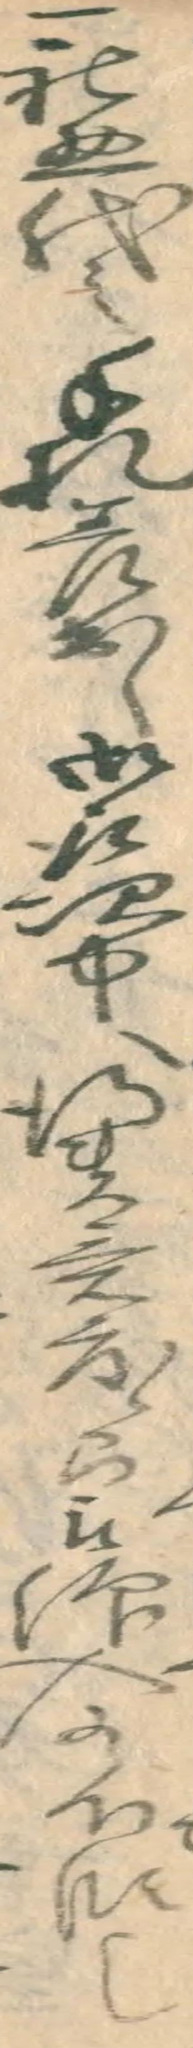一社惣代之手札差出し御取次中へ得貴意度候間被仰入可下段申候
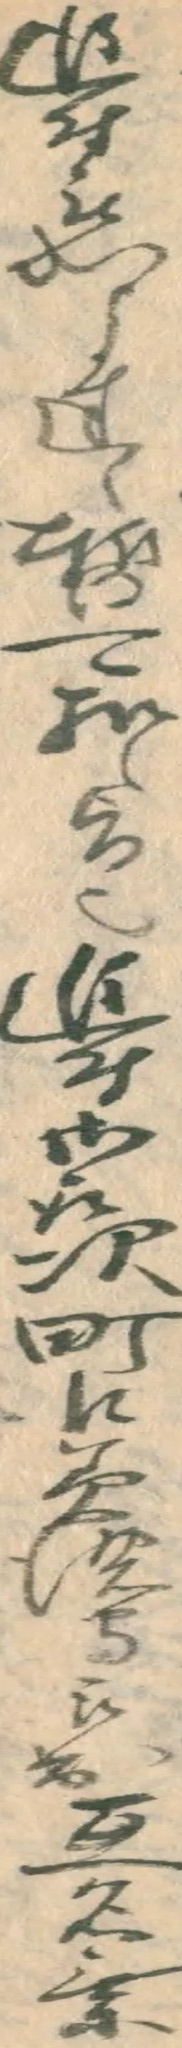追付被出申達候暫可扣之旨也追付御取次町江美濃守被出互名乗
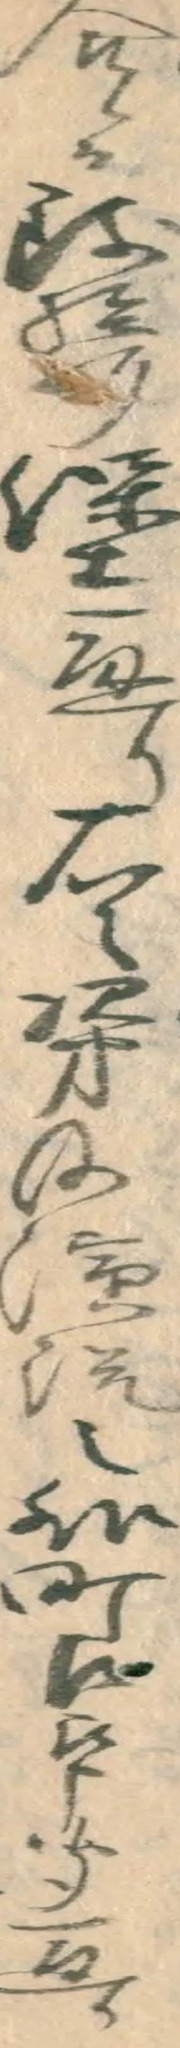合候而致挨拶保土一通り右之次第及演説之処町江被申聞一通り
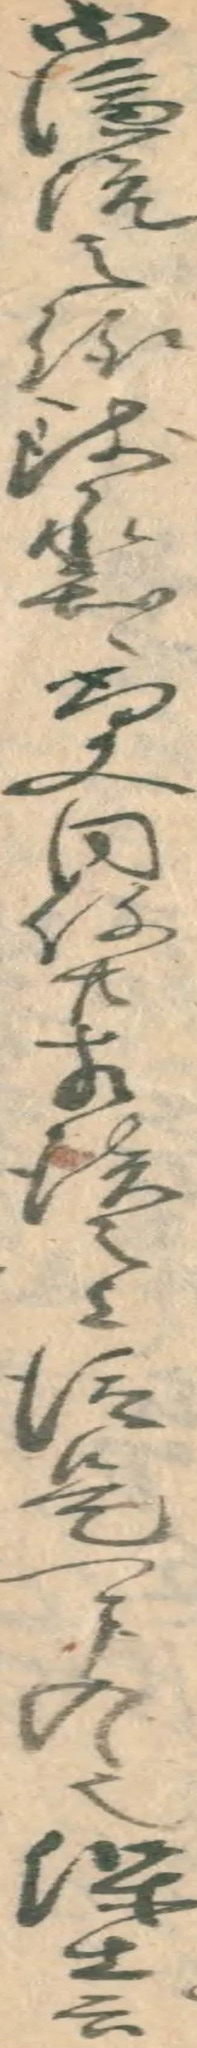御演説之趣致承知候尚又同役共相談之上従是可被申入也保土云
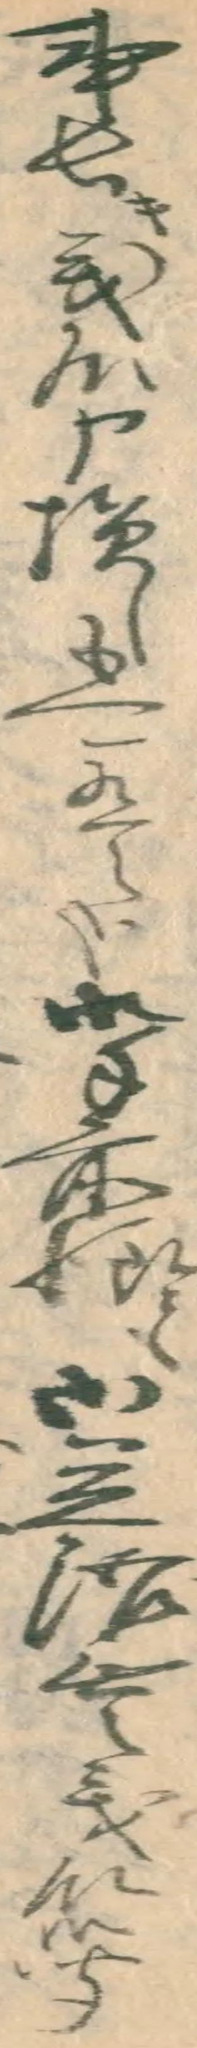事長キ義故申損しも可有之哉御手前様ニも御覚悟無之義故御聞
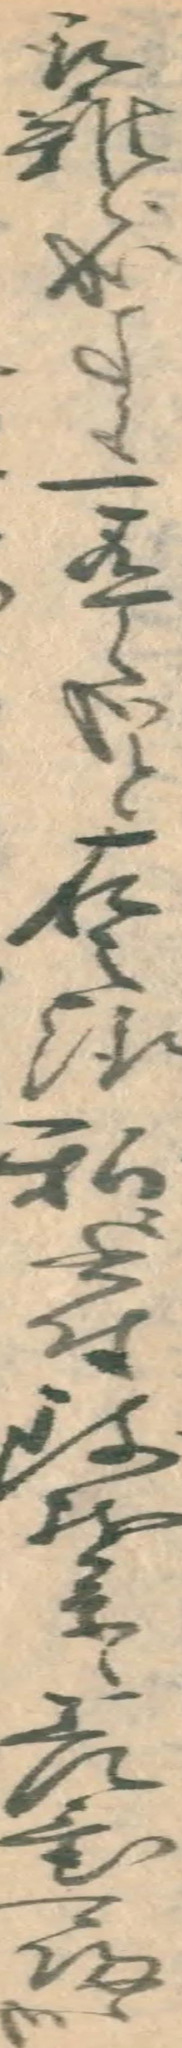取難被成事も可有之哉と右之趣私ニ書付致持参候差置可帰候哉
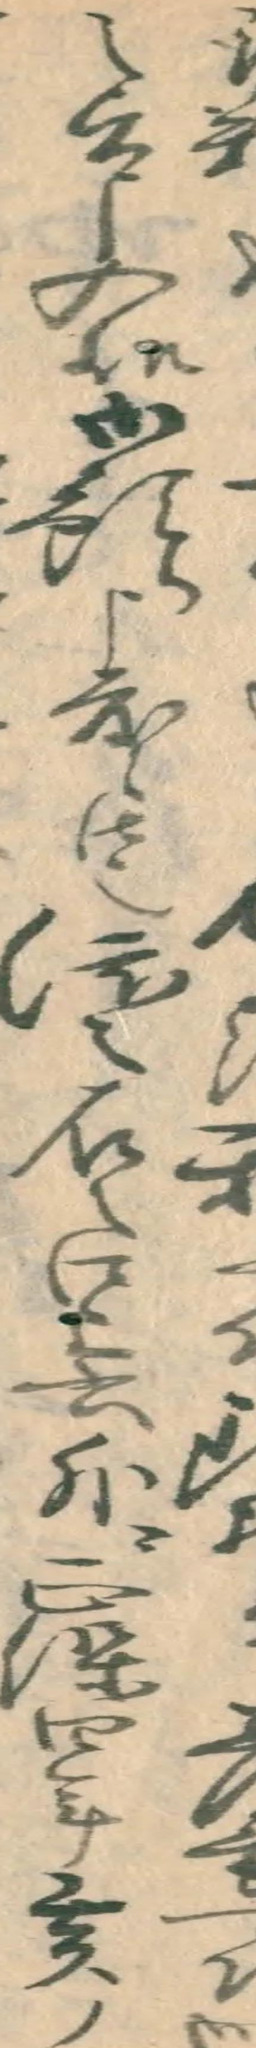之旨申入処御預り申度候由也依之右之口上書外ニ正保四年亥ノ
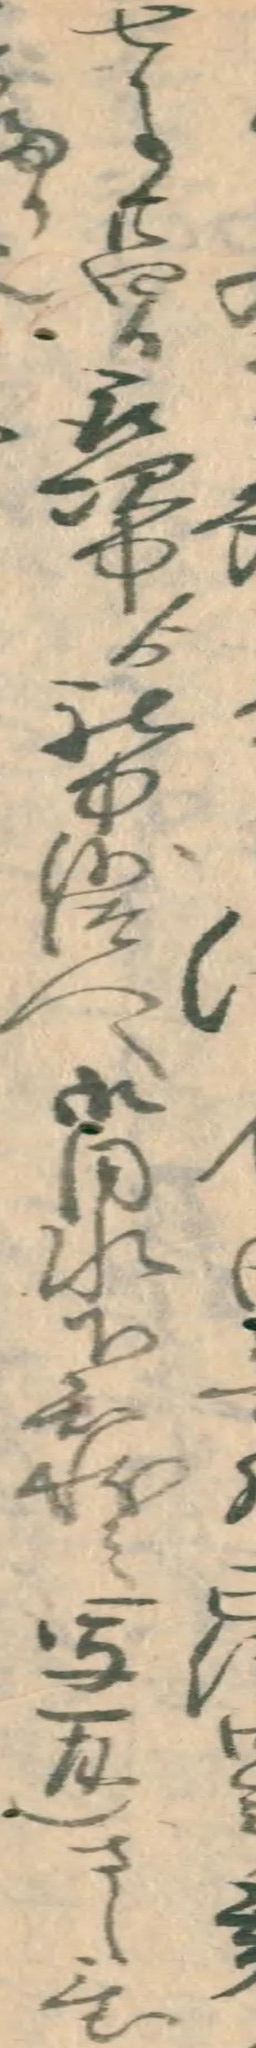七月廿四日取次中ゟ社中沙汰人へ御用水下知状之写一通さし置
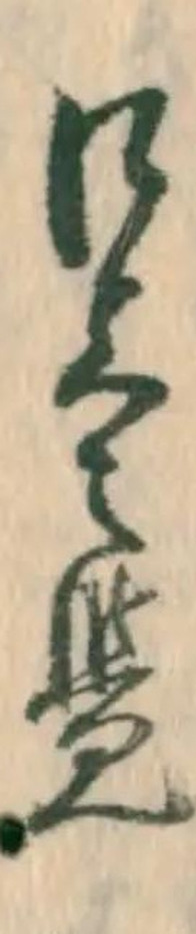口上之覚
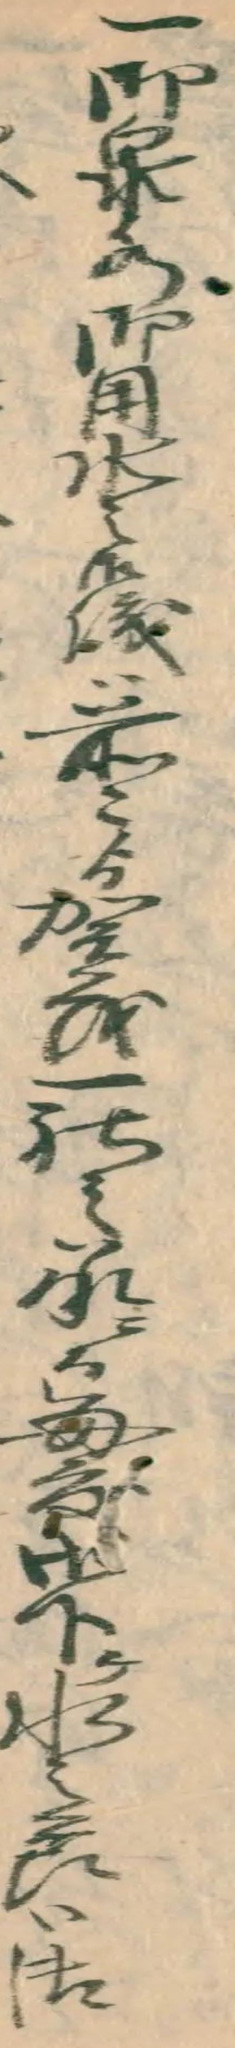一御泉水御用水之御儀ハ前々ゟ賀茂一社之承ニ而毎度御下ヶ水之節ハ御
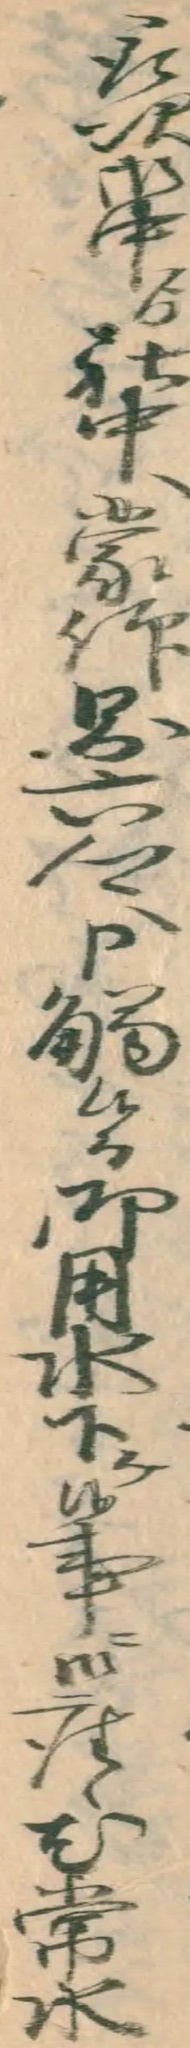取次御中ゟ社中へ蒙仰則六郷へ申触候而御用水下ヶ候事ニ御座候尤常水
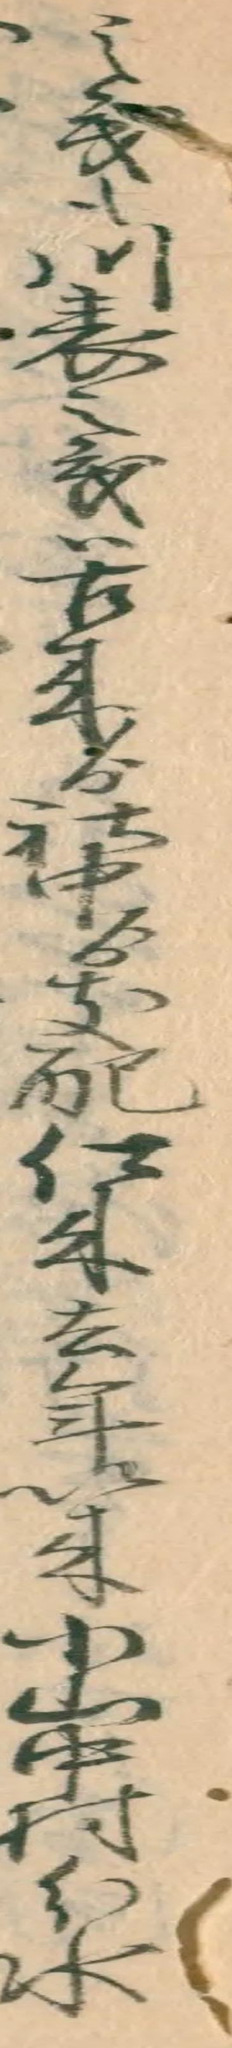之義も川表之義ハ古来ゟ社中ゟ支配仕来去年以来小山中村分水
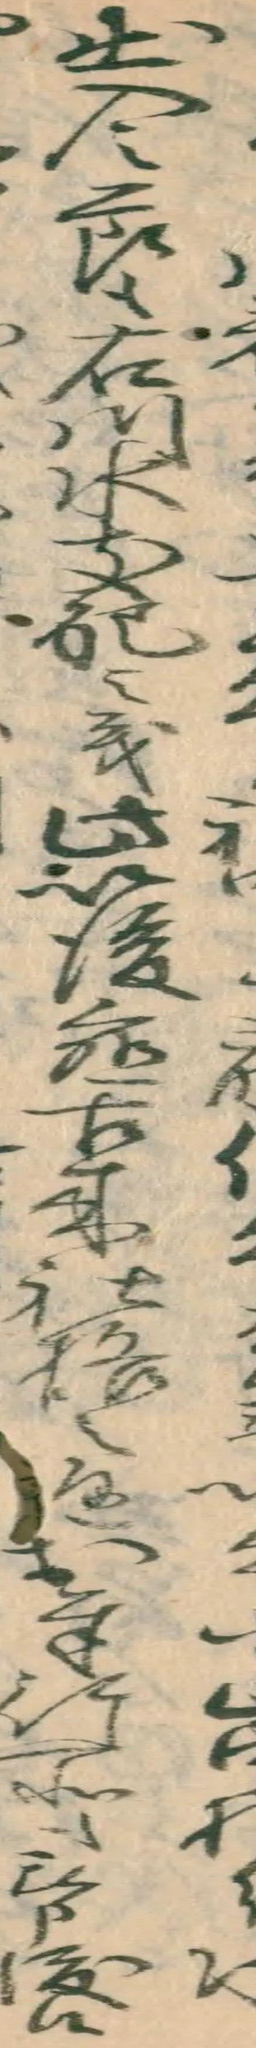出入之節も右川水支配之義此以後愈古来社格之通於奉行所も被申渡候
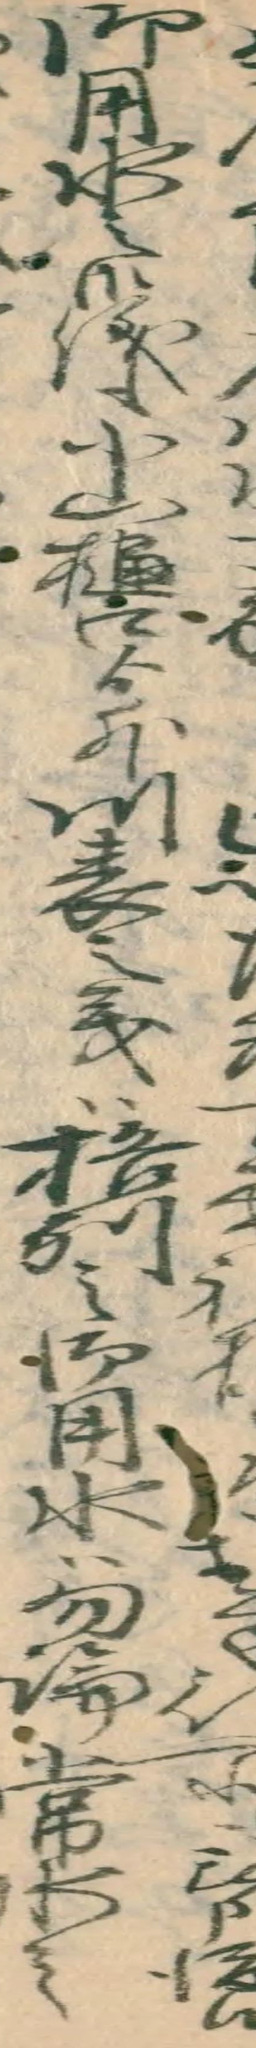御用水之御儀も小山樋口ゟ外川表之義ハ格別之御用水ハ勿論常水之
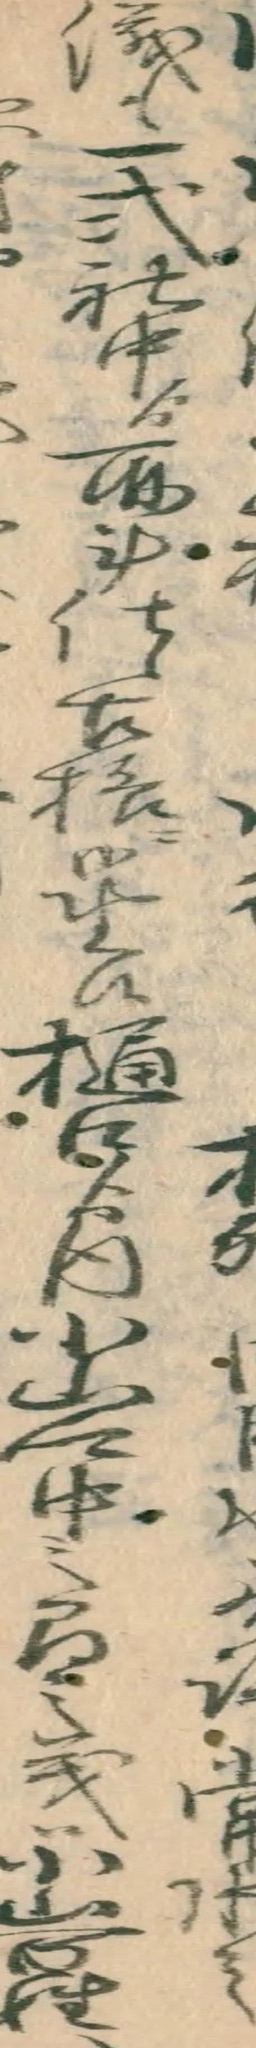儀も一式社中ゟ取計仕候古格ニ御座候樋口ゟ内小山郷中之間之義ハ小山百姓へ
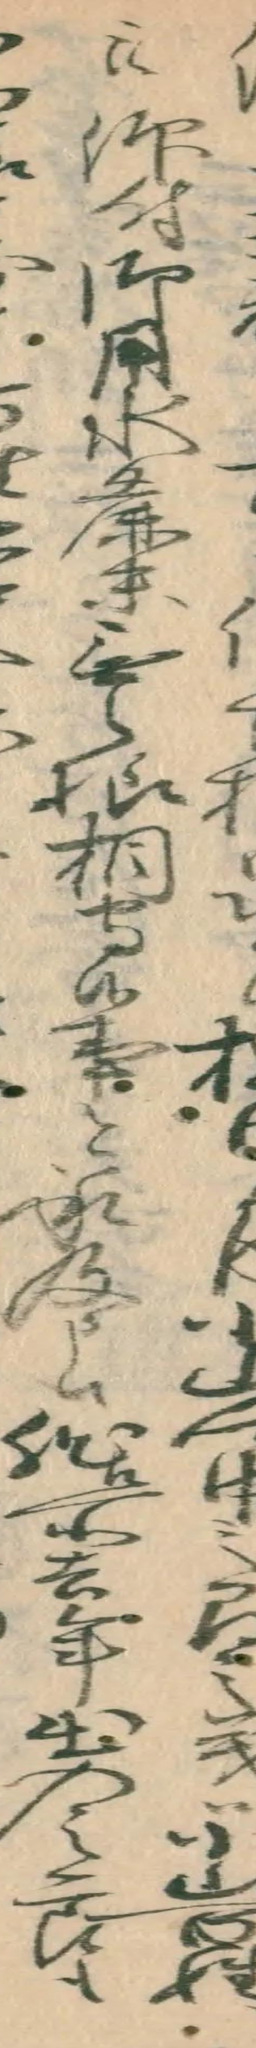被仰付御用水麁末無之様相守候事と承及申候然ル所去年出入之節も
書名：賀茂社記録. 第58冊
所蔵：国立国会図書館 National Diet Library, JAPAN
